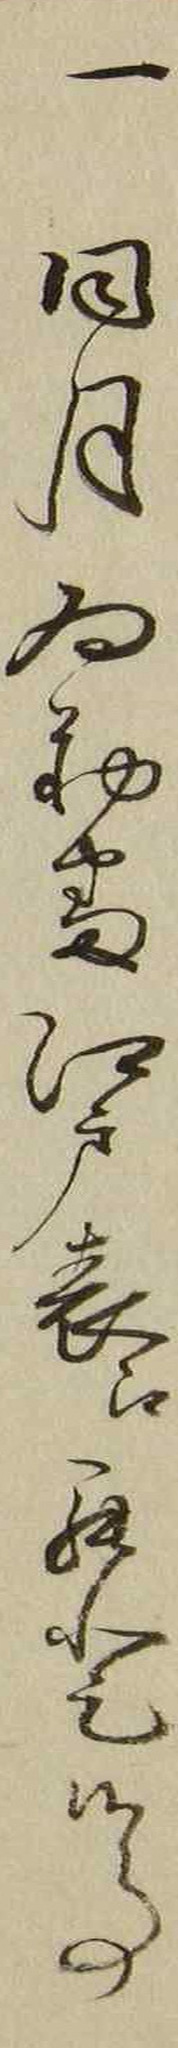一同月為勤番江戸表江罷登候事
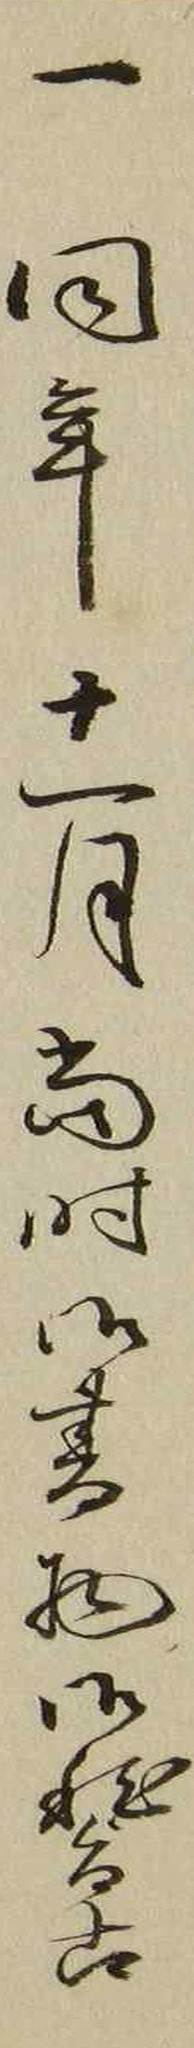一同年十一月当時御書物御稽古
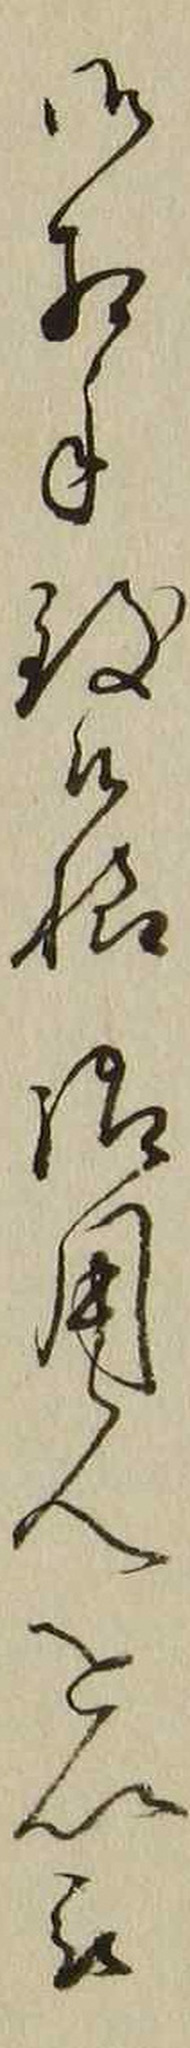御相手致候様御用人を以被
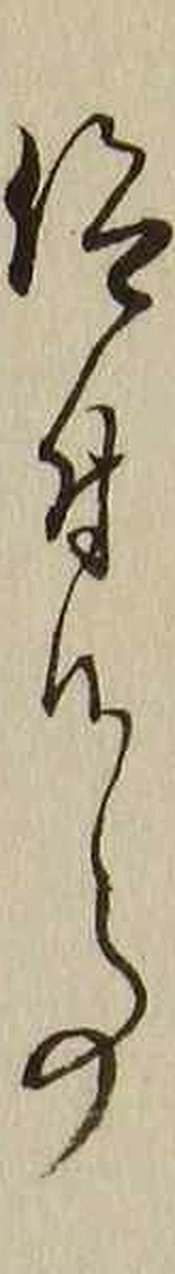仰付候事
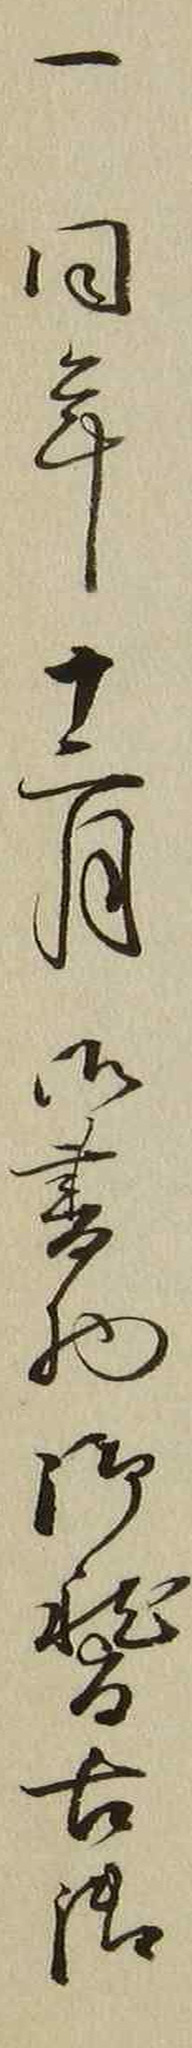一同年十二月御書物御稽古御
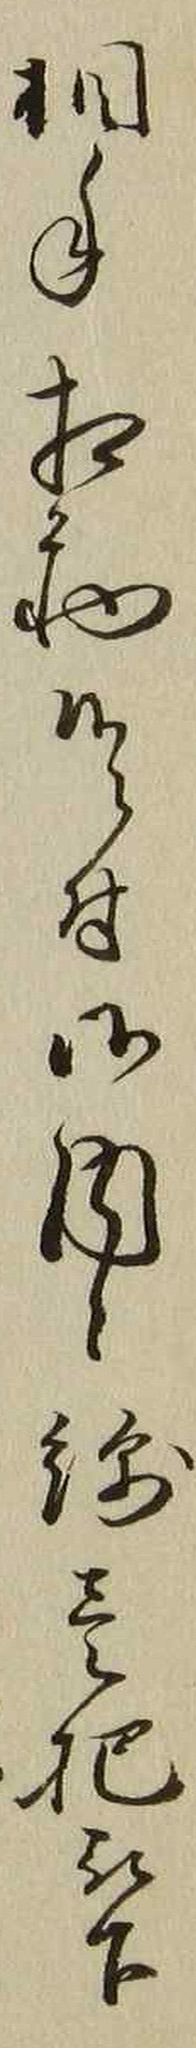相手相勤候に付御内々綿壱把被下
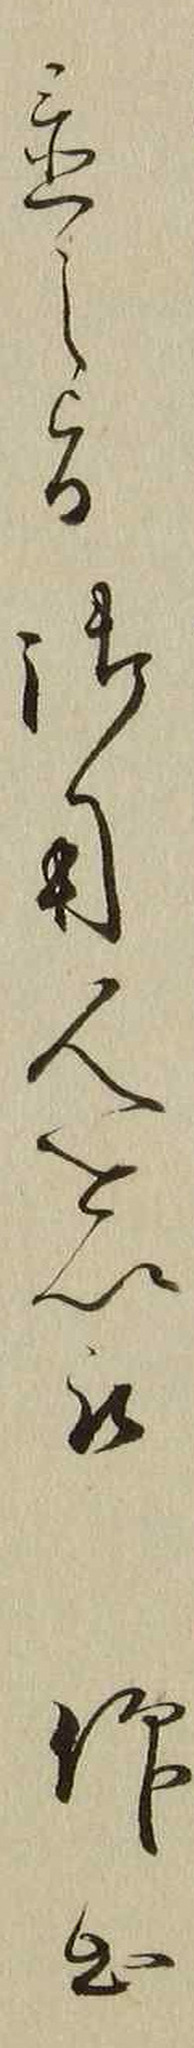置の旨御用人を以被仰出
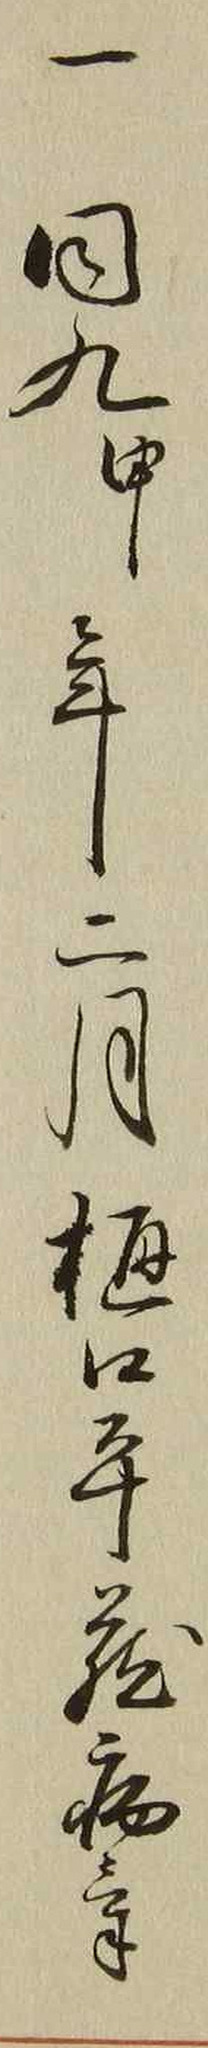一同九申年二月樋口平蔵病気
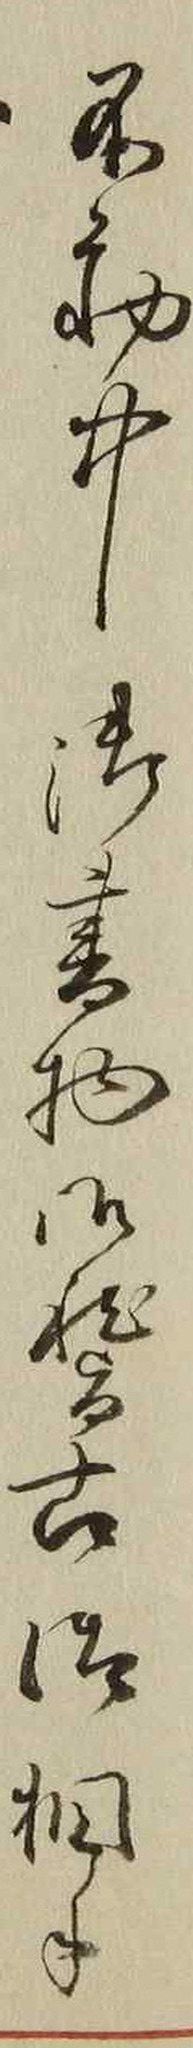不勤中御書物御稽古御相手
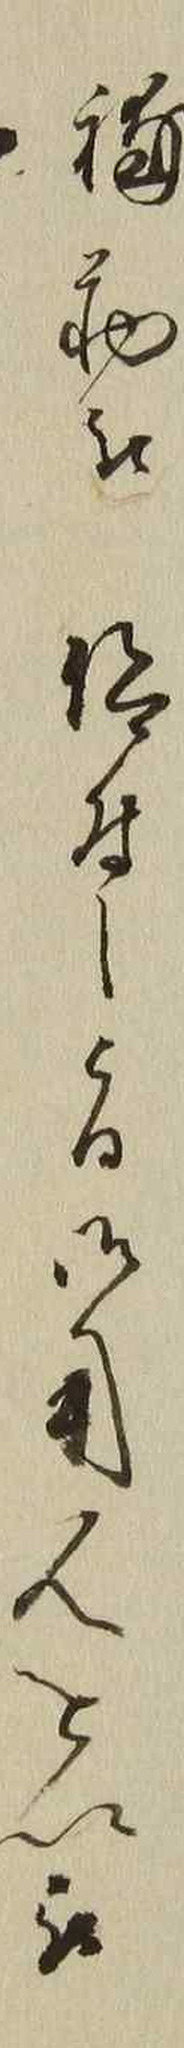補勤被仰付の旨御用人を以被
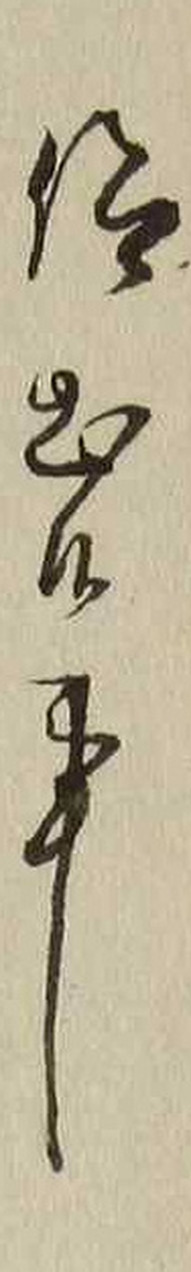仰出候事
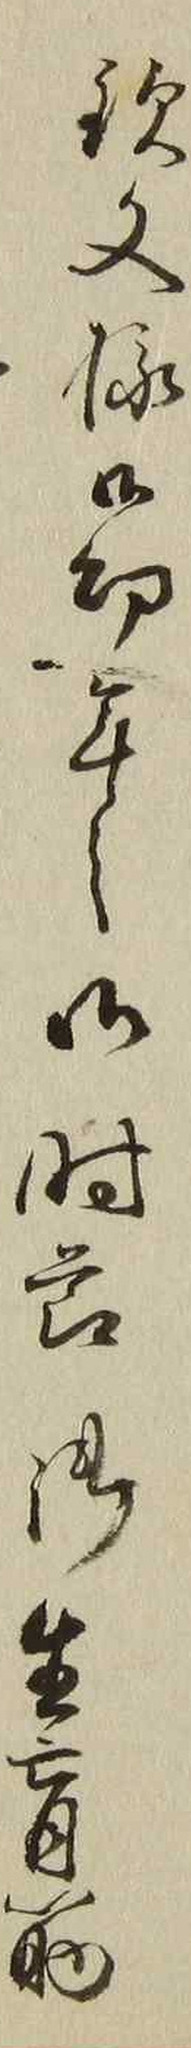欽文様御幼年の御時節御生育筋
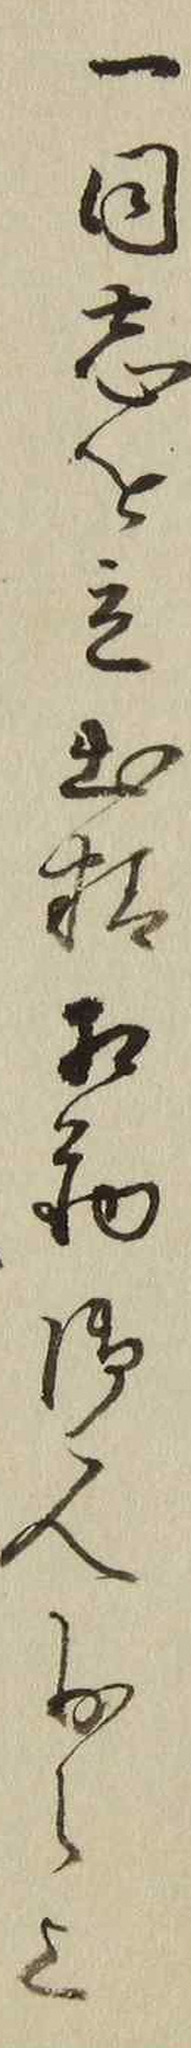一同志を立出精相勤御人少の上
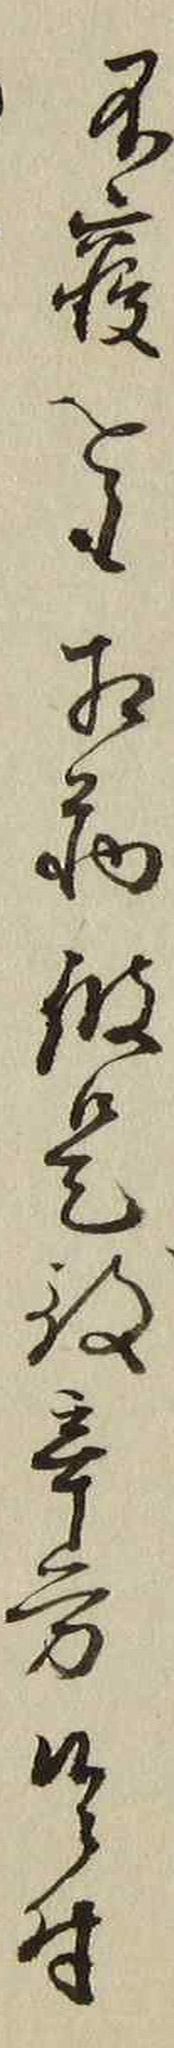不寝をも相勤彼是致辛労候に付
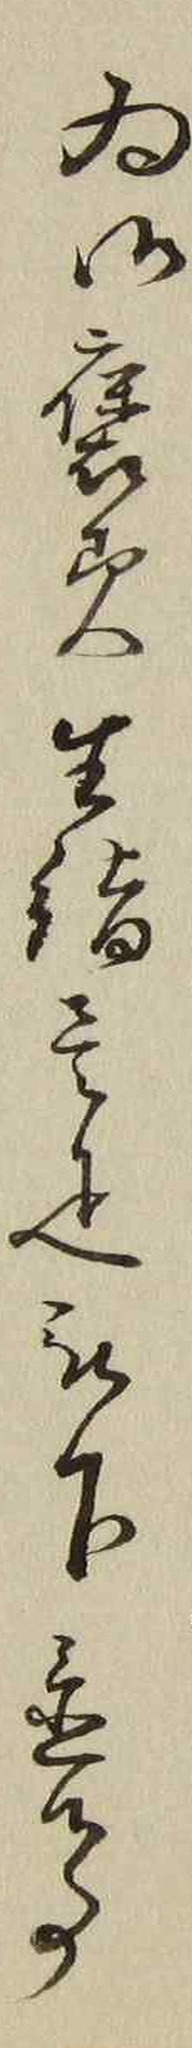為御褒美生絹壱疋被下置候事
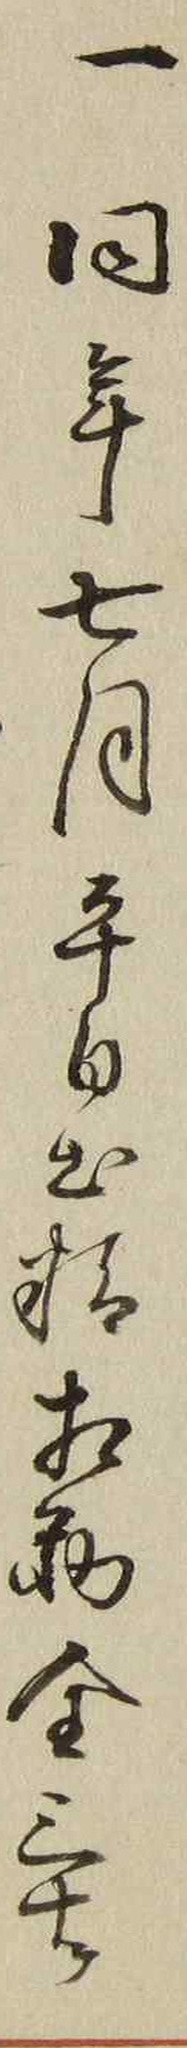一同年七月平日出精相勤全三十ケ
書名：諸士系譜　巻之1　い之部1
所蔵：会津若松市立会津図書館
